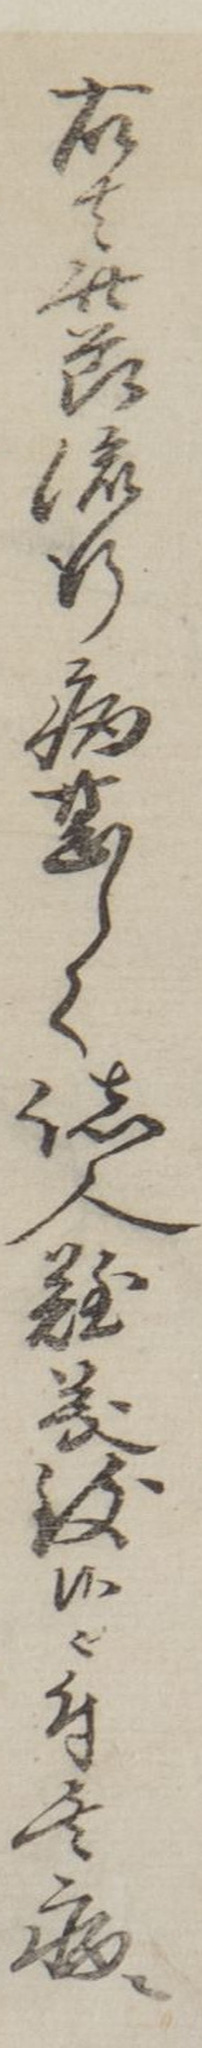右は此節流行病甚しく諸人難義致候に付其病に
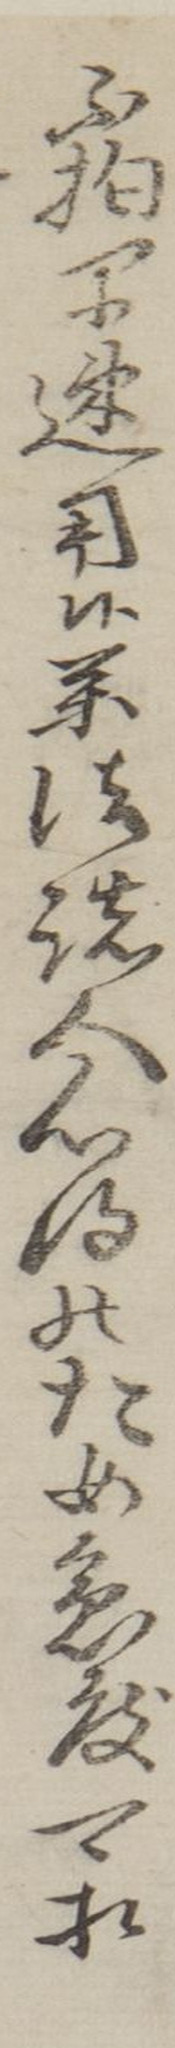不拘早速用候薬法諸人心得のため急度可相
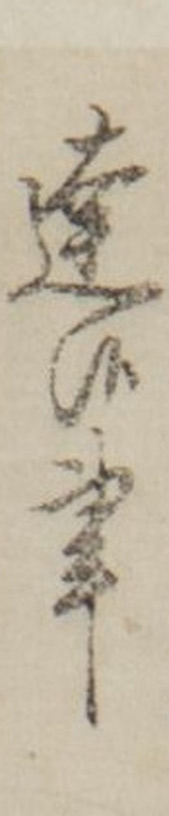達候事
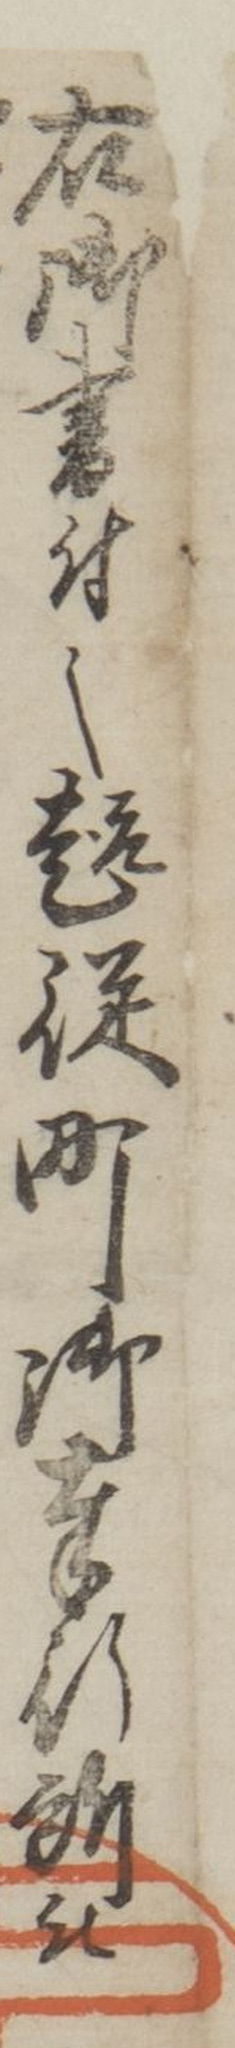右御書付之趣従町奉行所被
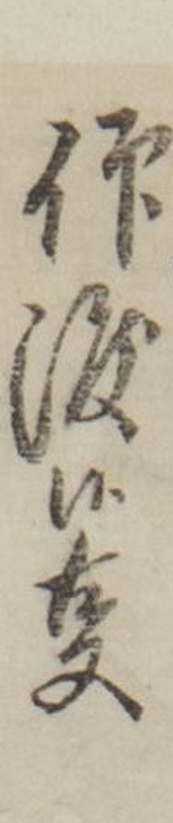仰渡候事
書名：流行暴瀉病療治の御觸書の写
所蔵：あいおいニッセイ同和損保株式会社
